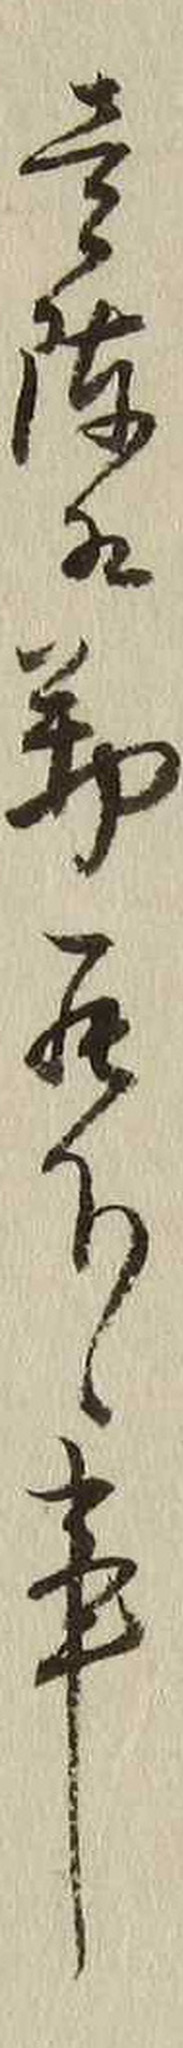壱陣相勤罷下候事
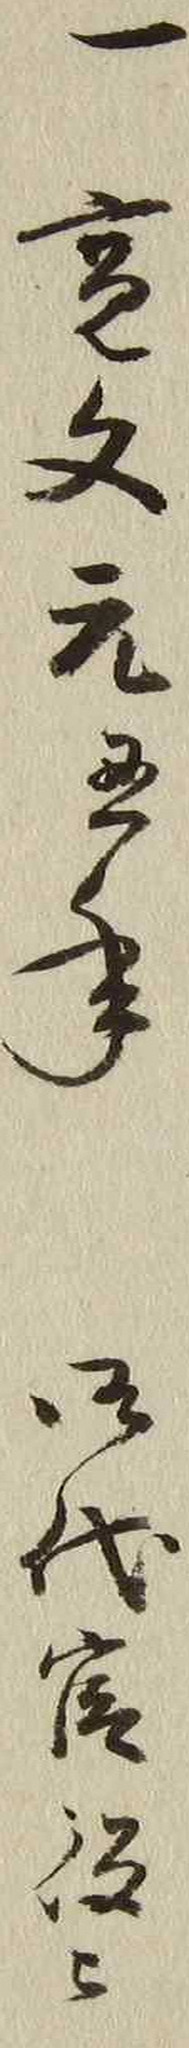一寛文元丑年御代官役被
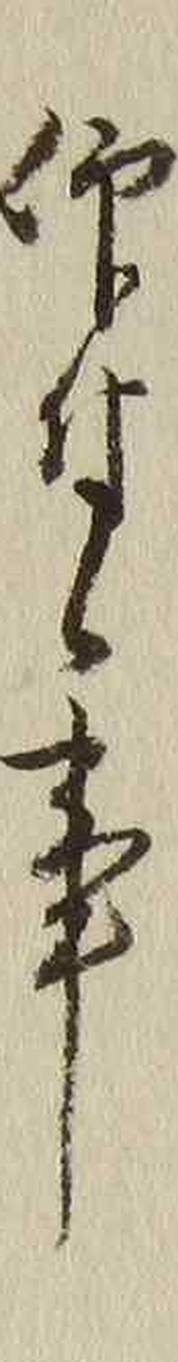仰付候事
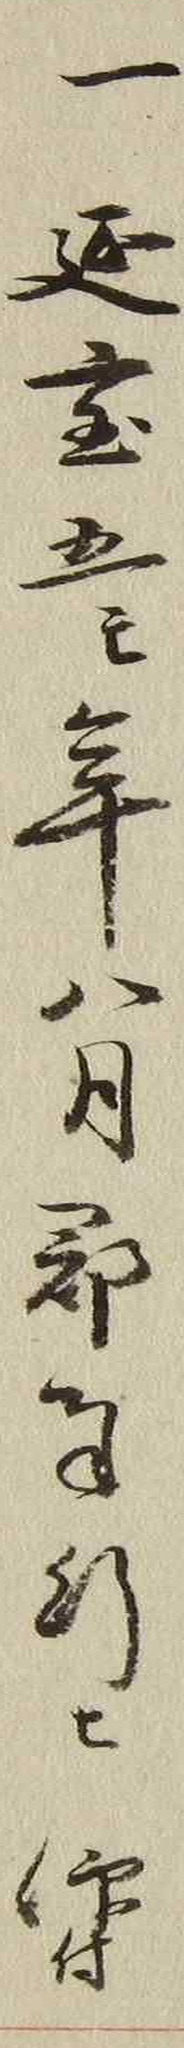一延宝五巳年八月郡奉行被仰付
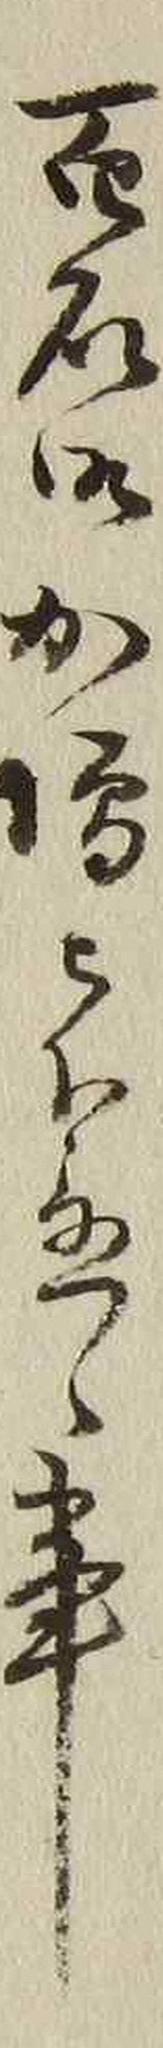百石御加増被下置候事
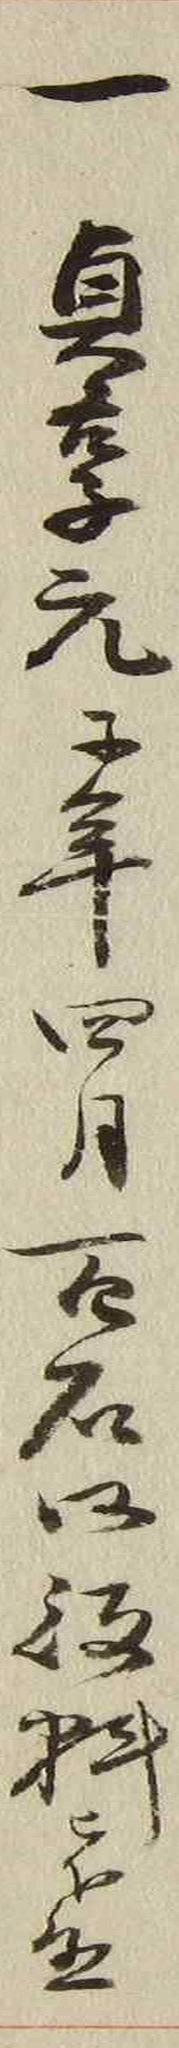一貞享元子年四月百石御役料被下置
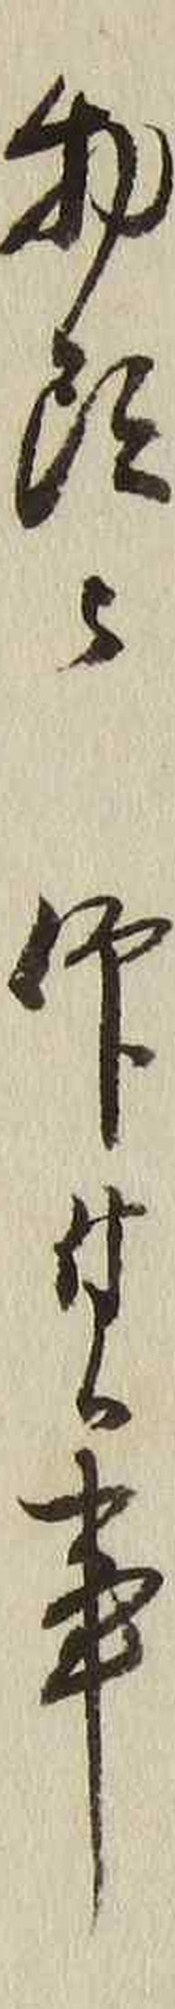物頭被仰付候事
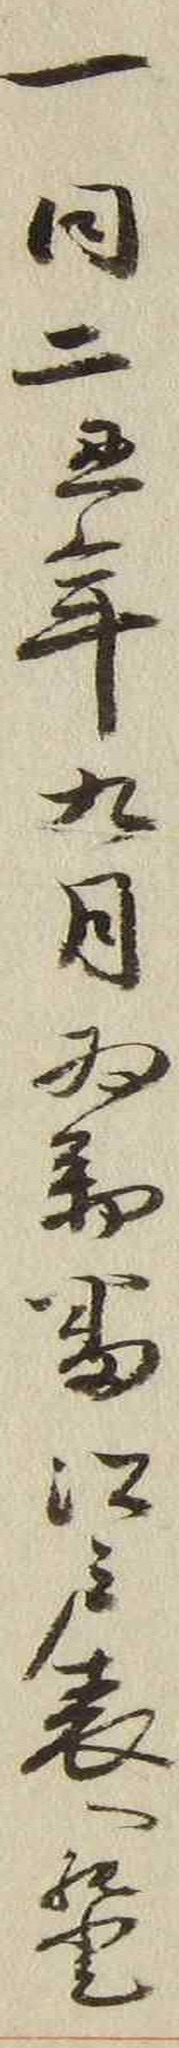一同二丑年九月為勤番江戸表へ罷登
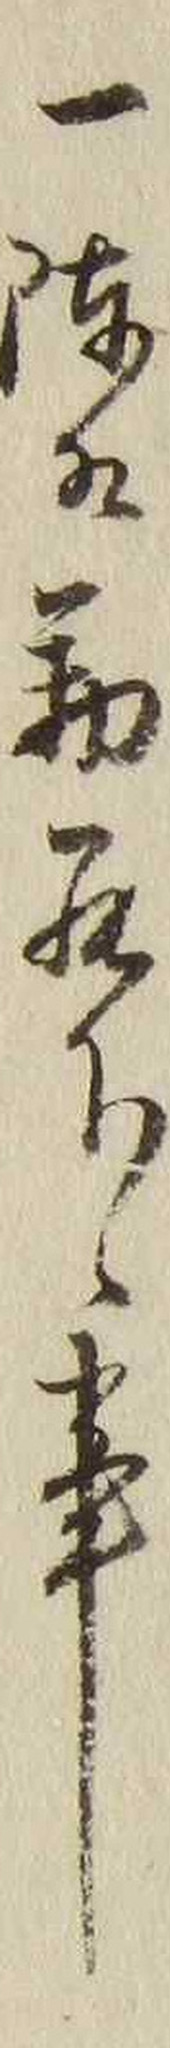一陣相勤罷下候事

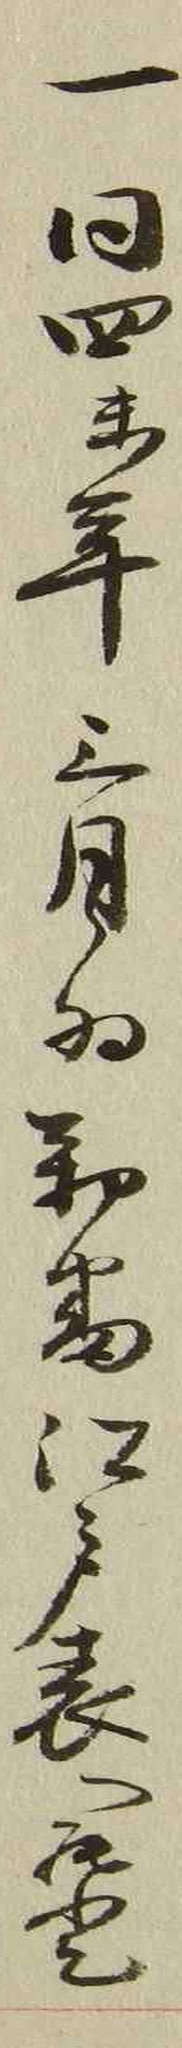一同四未年三月為勤番江戸表へ罷登
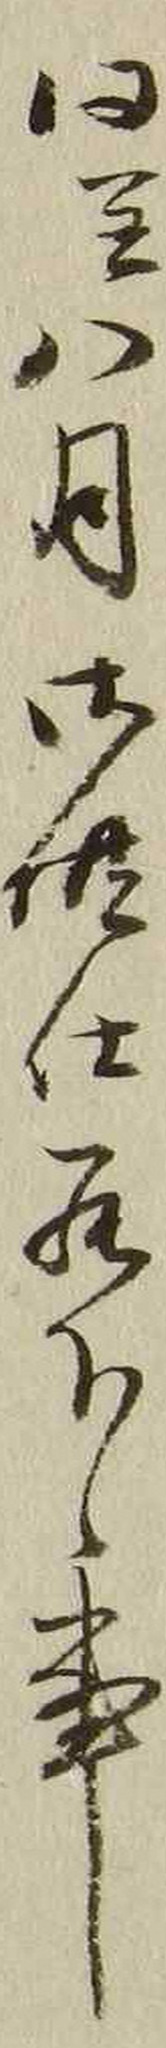同閏八月御供仕罷下候事
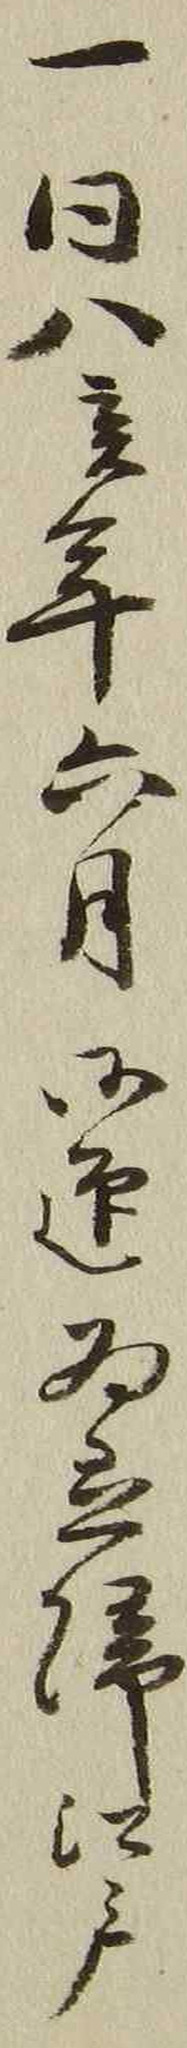一同八亥年六月御迎為立帰江戸
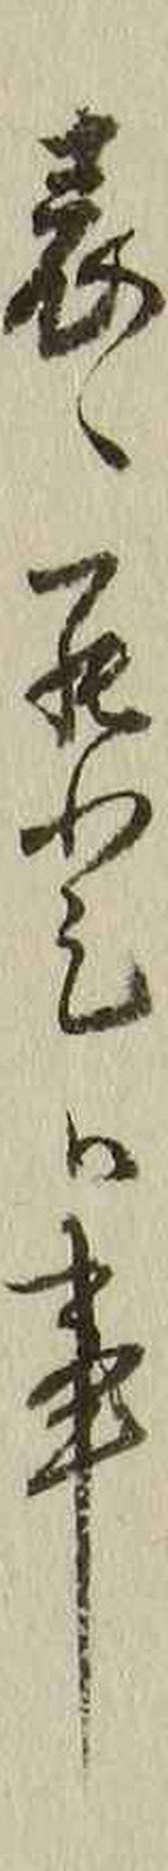表へ罷登候事
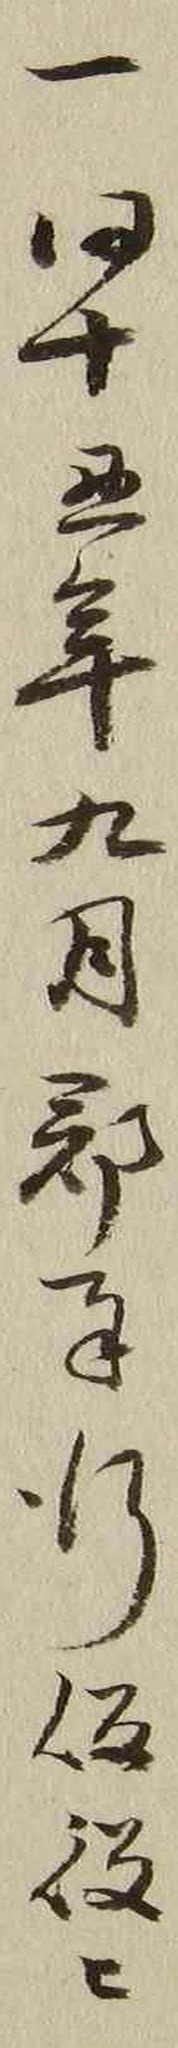一同十丑年九月郡奉行仮役被
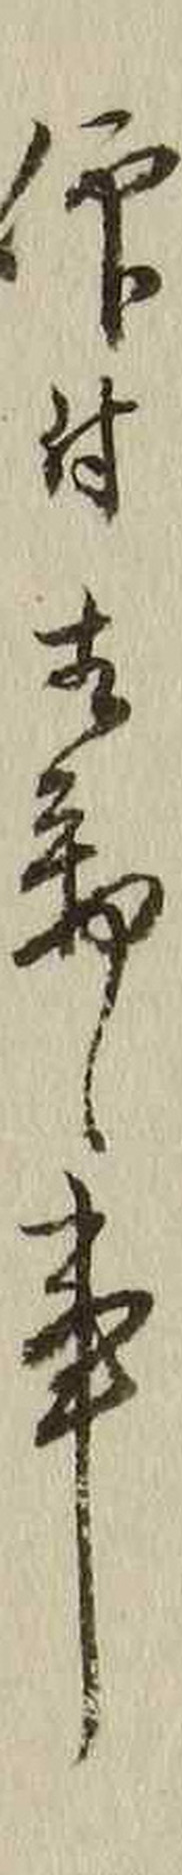仰付相勤候事
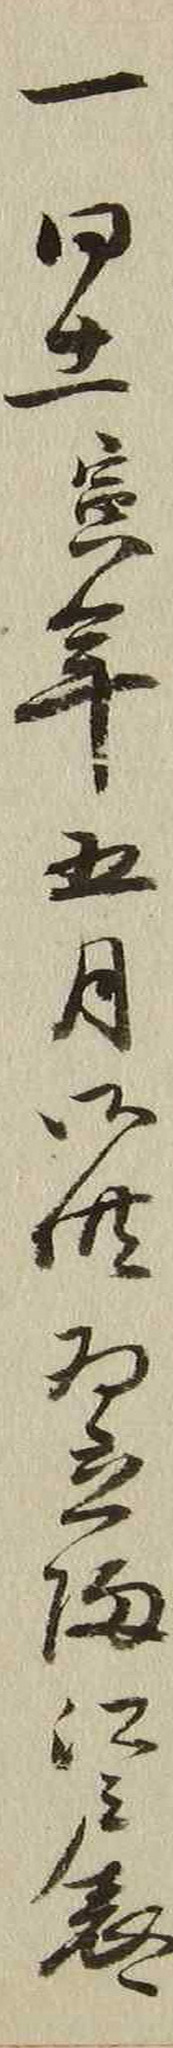一同十一寅年五月御供為立帰江戸表へ
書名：諸士系譜　巻之236　ふ之部4
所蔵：会津若松市立会津図書館
